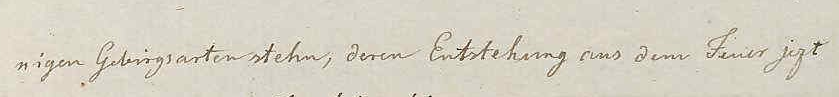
nigen Gebirgsarten stehn, deren Entstehung aus dem Feuer jezt
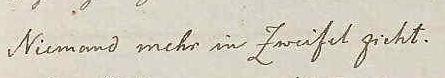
Niemand mehr in Zweifel zieht.
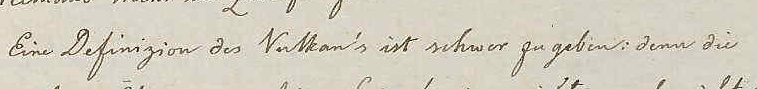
Eine Definizion des Vulkan's ist schwer zu geben: denn die
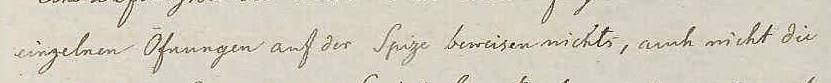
einzelnen Öfnungen auf der Spize beweisen nichts, auch nicht die
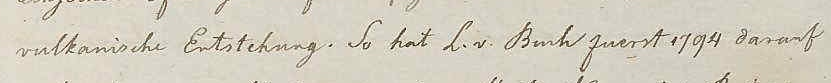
vulkanische Entstehung. So hat L. v. Buch zuerst 1794 darauf
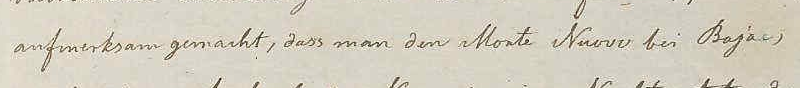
aufmerksam gemacht, dass man den Monte Nuovo bei Bajae,
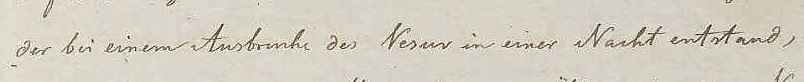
der bei einem Ausbruche des Vesuv in einer Nacht entstand,
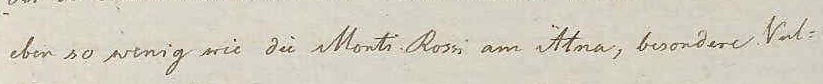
eben so wenig wie die Monti Rossi am Ätna, besondere Vul-
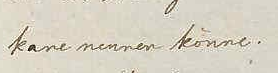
kane nennen könne.
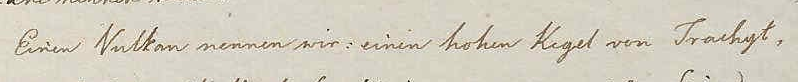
Einen Vulkan nennen wir: einen hohen Kegel von Trachyt,
